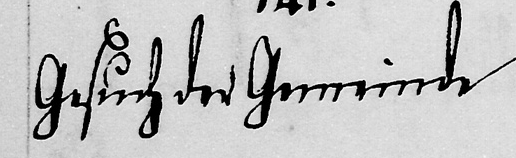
Gesuch der Gemeinde
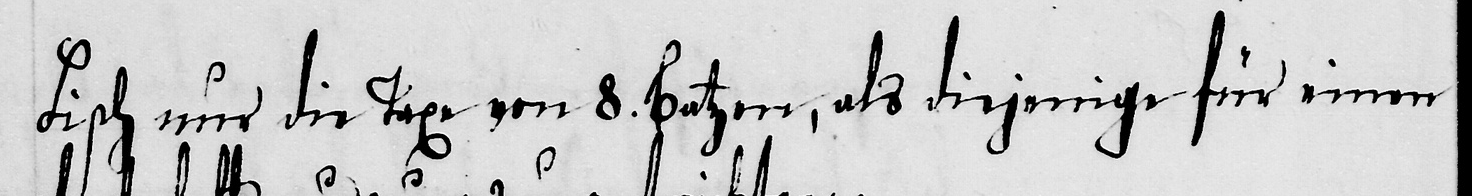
Fisch nur die Taxe von 8. Batzen, als diejenige für einen
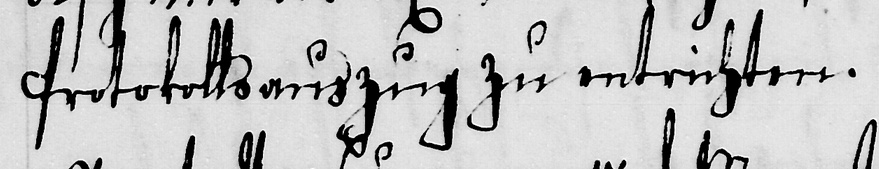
Protokollsauszug zu entrichten.
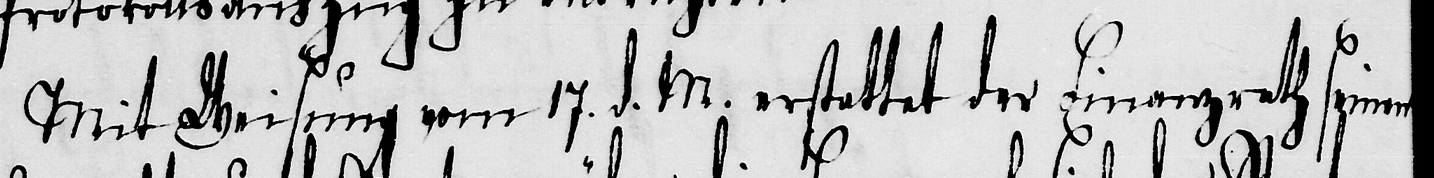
Mit Weisung vom 17. d. M. erstattet der Finanzrath seinen
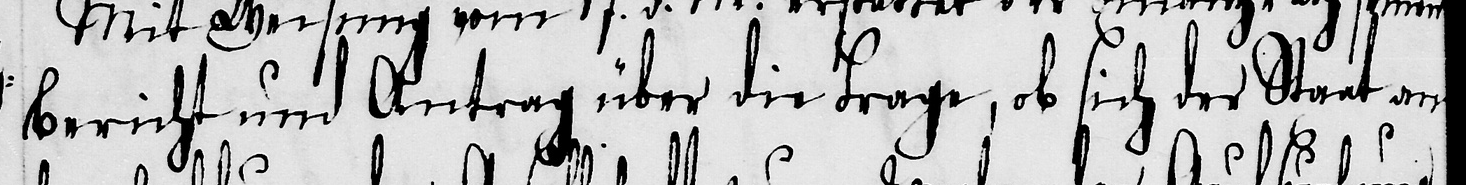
Bericht und Antrag über die Frage, ob sich der Staat an
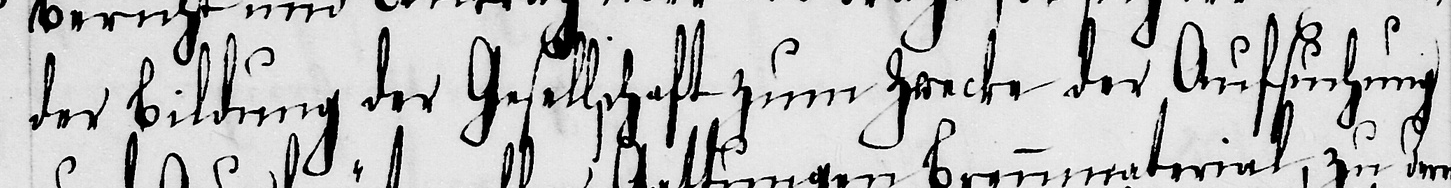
der Bildung der Gesellschaft zum Zwecke der Aufsuchung
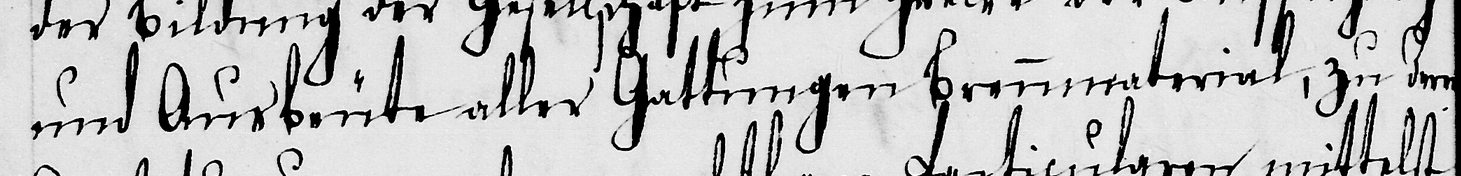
und Ausbeute aller Gattungen Brennmaterial, zu der¬
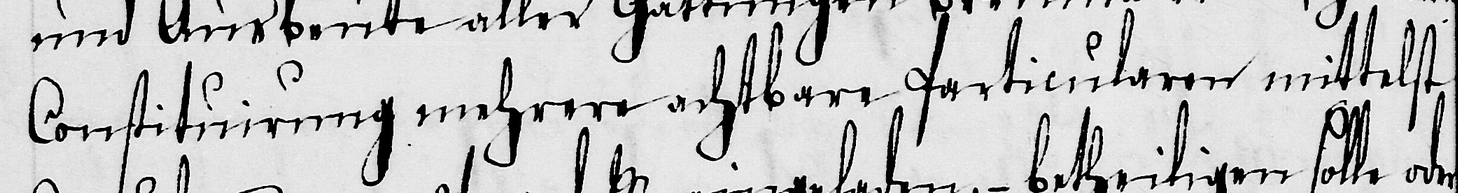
Constituirung mehrere achtbare Particularen mittelst
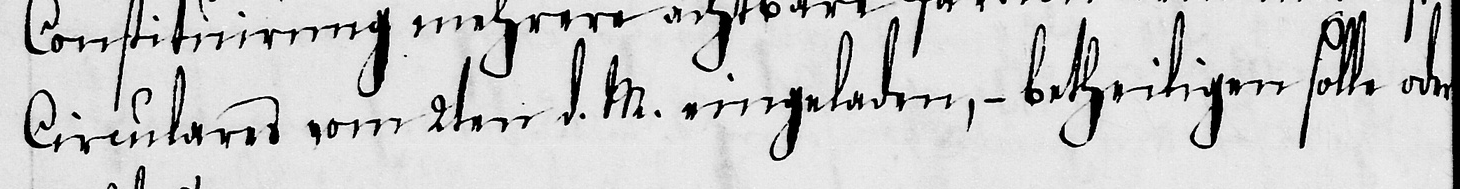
Circulares vom 2ten d. M. eingeladen, – betheiligen solle
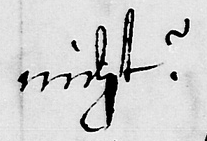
nicht?
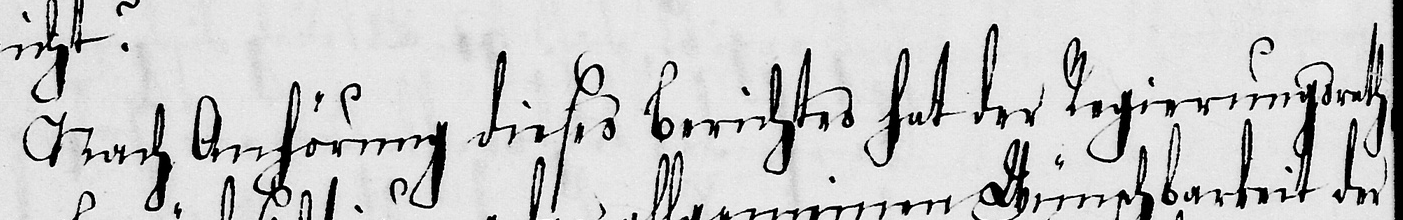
Nach Anhörung dieses Berichtes hat der Regierungsrat¬
